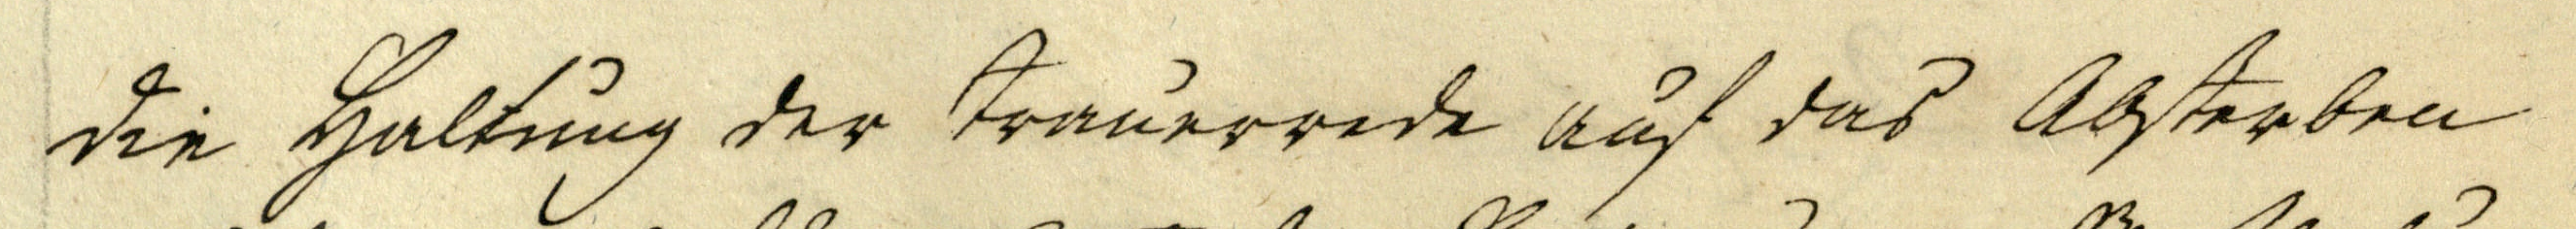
die Haltung der Trauerrede auf das Absterben
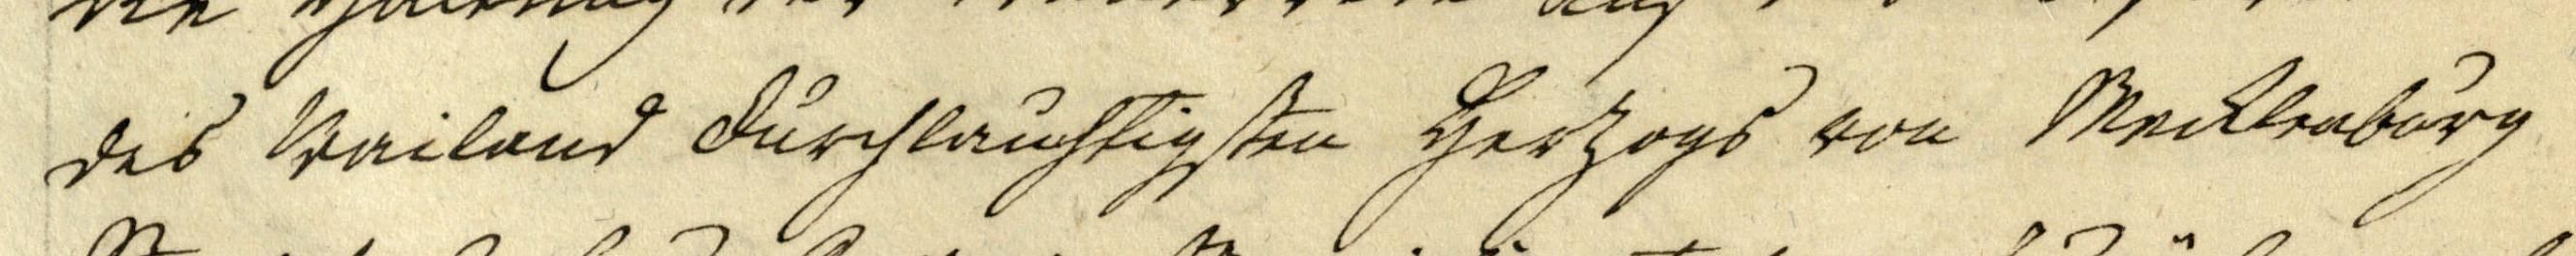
des wailand durchlauchtigsten Herzogs von Mecklenburg
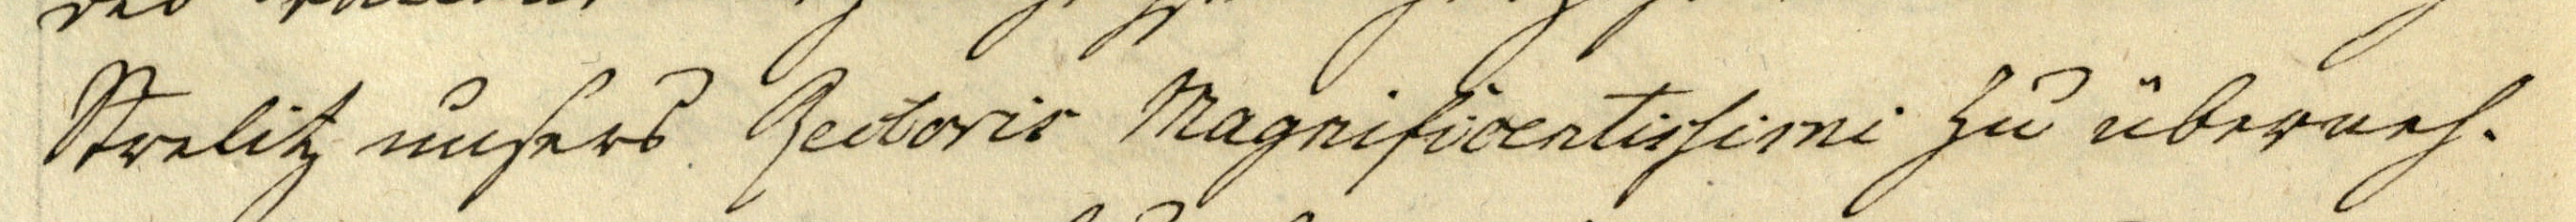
Strelitz unsers Rectoris Magnificentissimi zu überneh¬
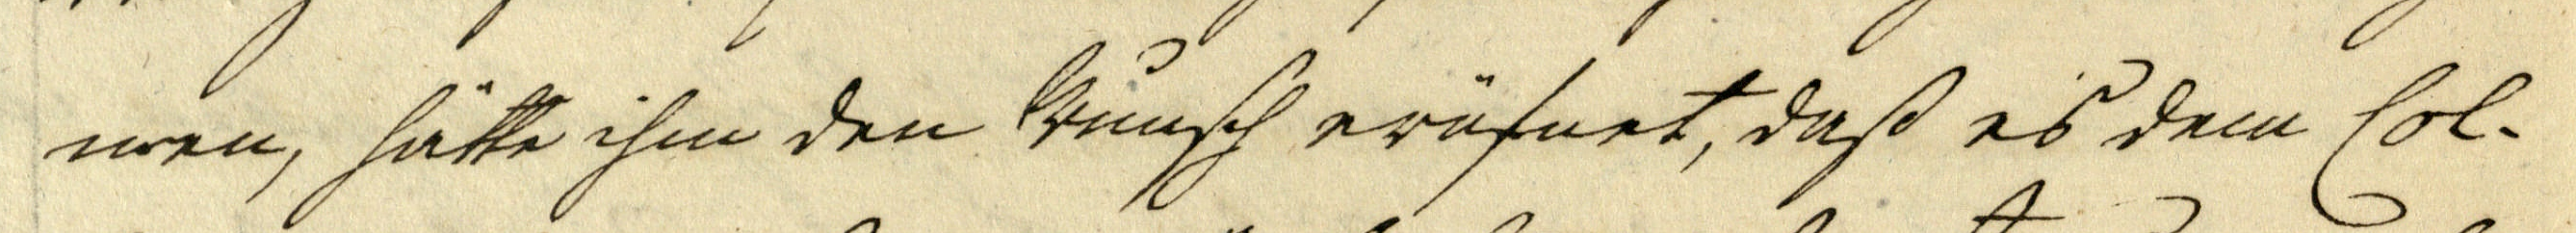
men, hätte ihm den Wunsch eröfnet, daß es dem Col¬
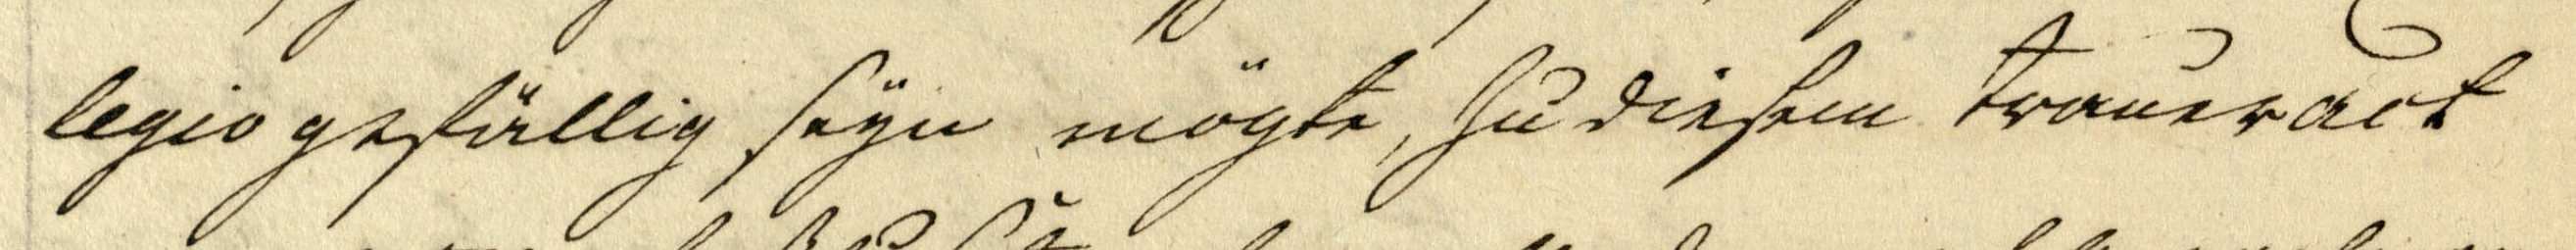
legio gefällig seyn mögte, zu diesem Traueract
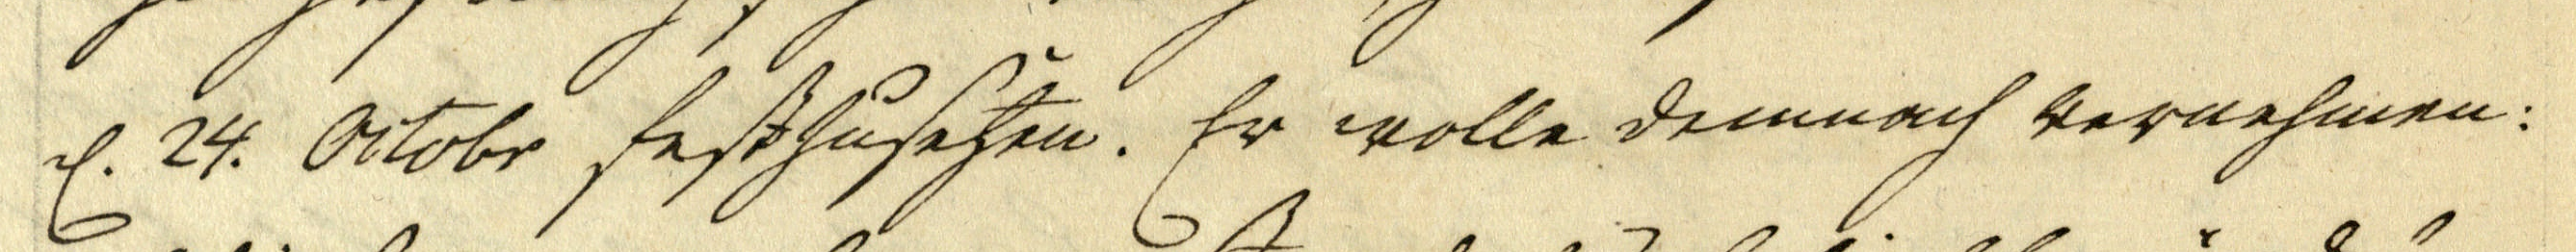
d. 24. Octobr festzusetzen. Er wolle demnach vernehmen:
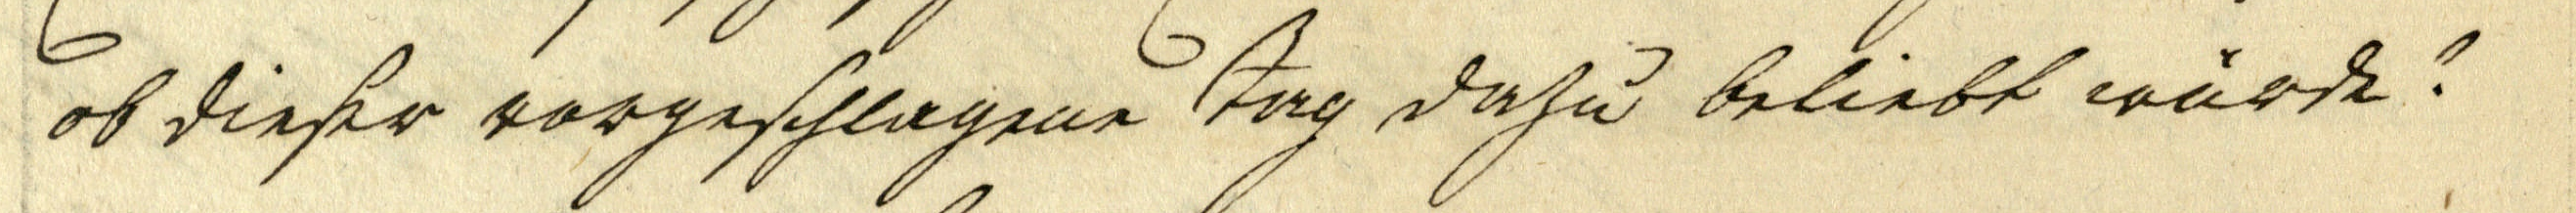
ob dieser vorgeschlagene Tag dazu beliebt würde?
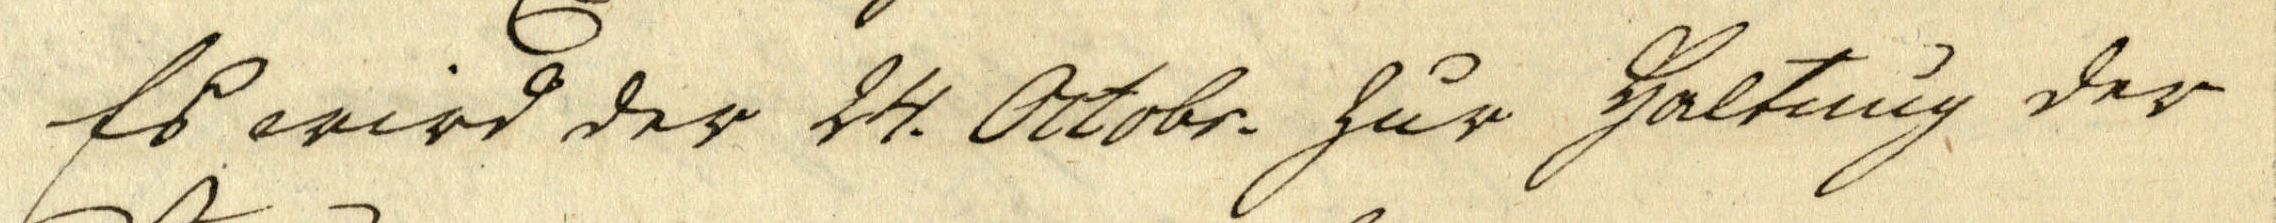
Es wird der 24. Octobr. zur Haltung der
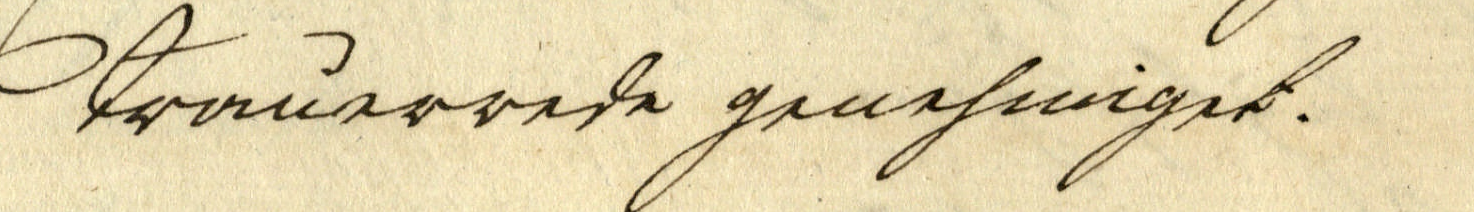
Trauerrede genehmiget.
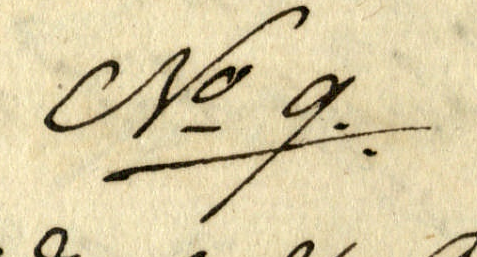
No 9.
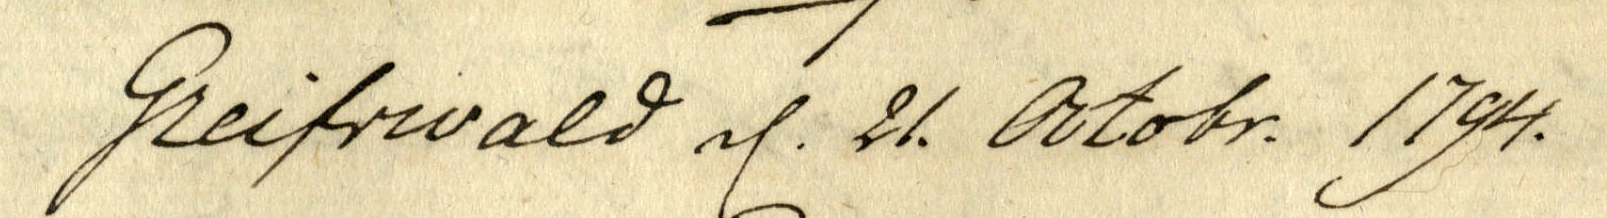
Greifswald d. 21. Octobr. 1794.
